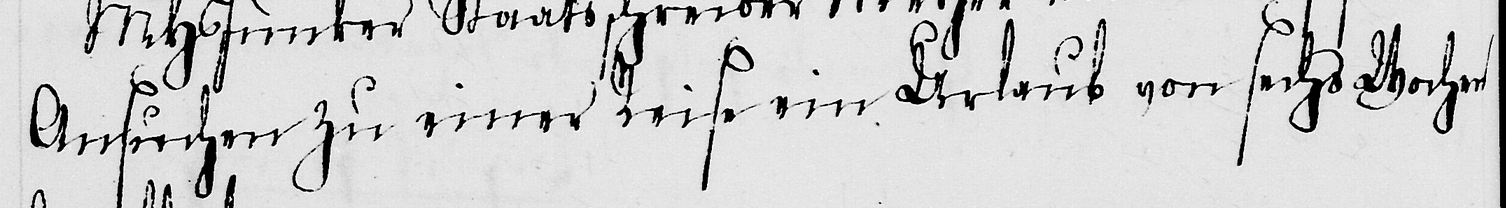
Ansuchen zu seiner Reise ein Urlaub von sechs Wochen
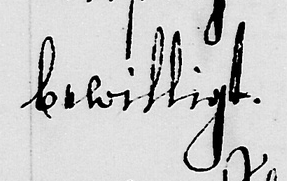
bewilligt.
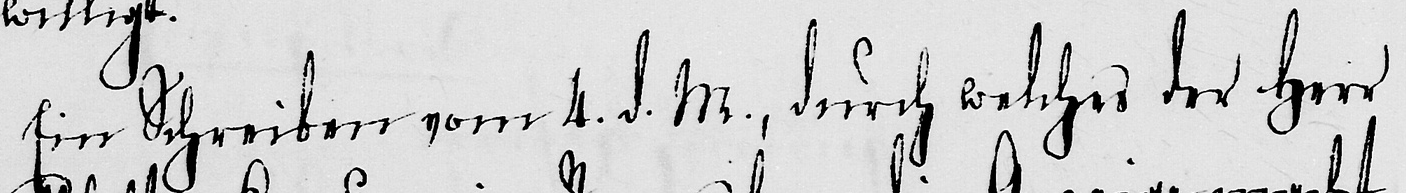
Ein Schreiben vom 4. d. M., durch welches der Herr
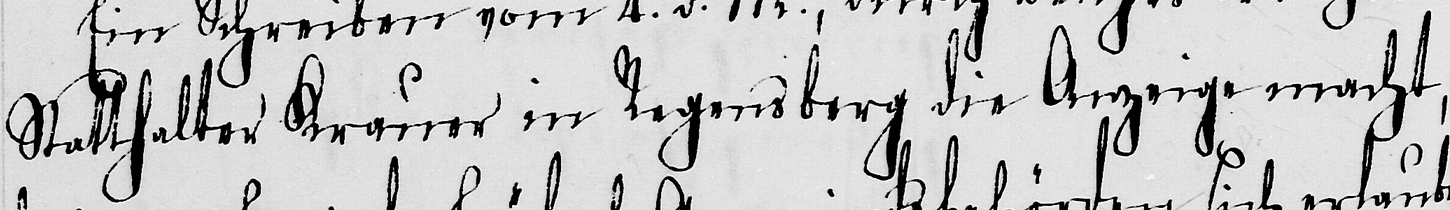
Statthalter Krauer in Regensberg die Anzeige macht,
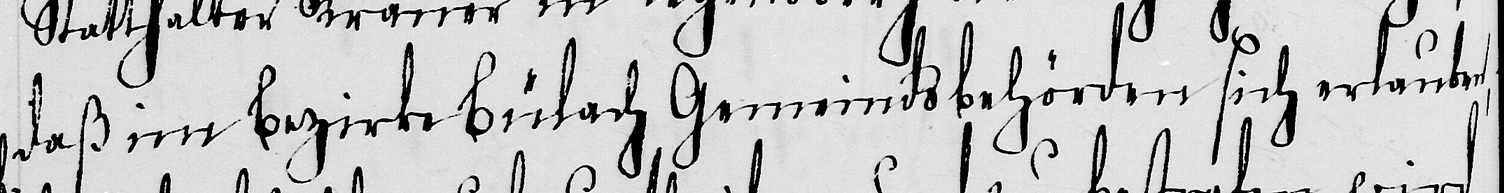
daß im Bezirke Bülach Gemeindsbehörden sich erlaube¬
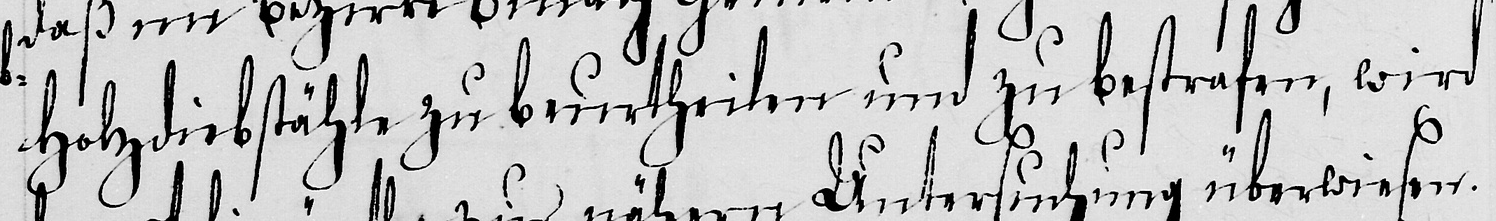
Holzdiebstähle zu beurtheilen und zu bestrafen, wird
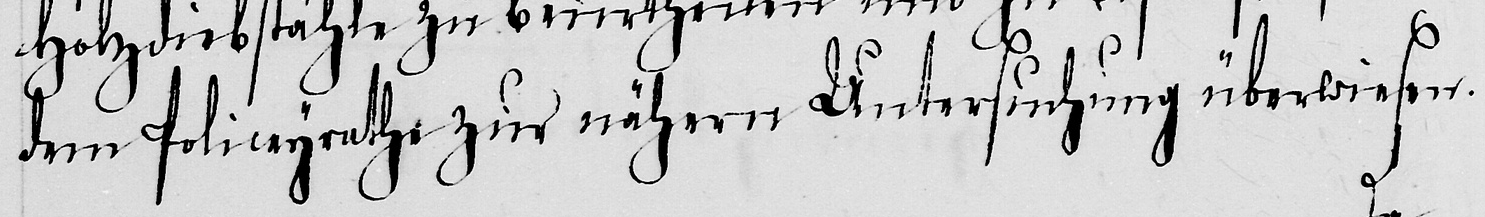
dem Policeyrathe zur nähern Untersuchung überwiesen.
